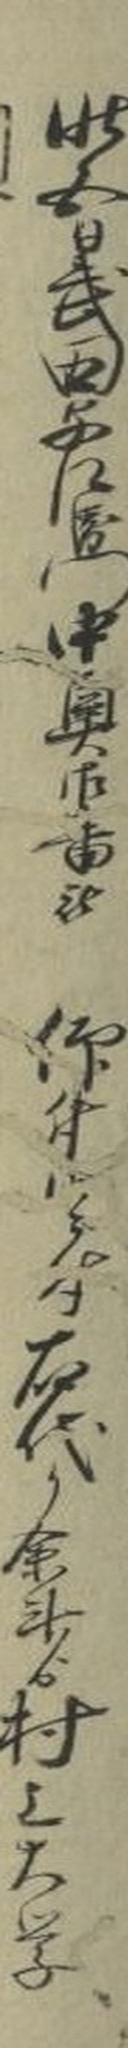一昨五日武田与左衛門中奥御番被仰付候に付右代り余計ゟ村上大学
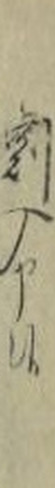割入申候
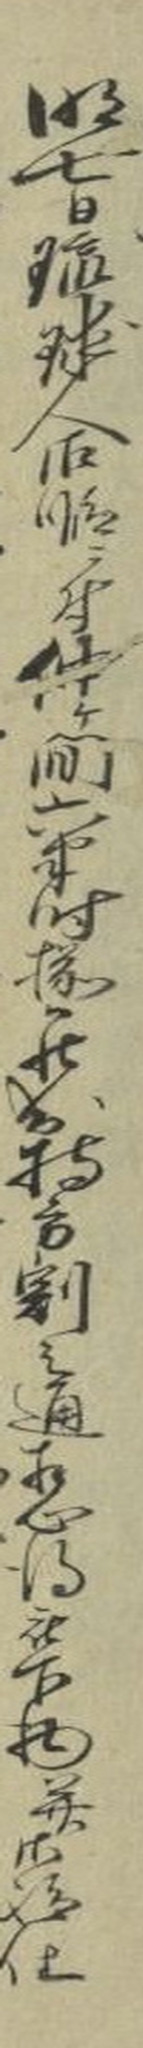一明七日琉球人御暇に付仲か間六半時揃罷出持方割之通相心得被下物并御給仕
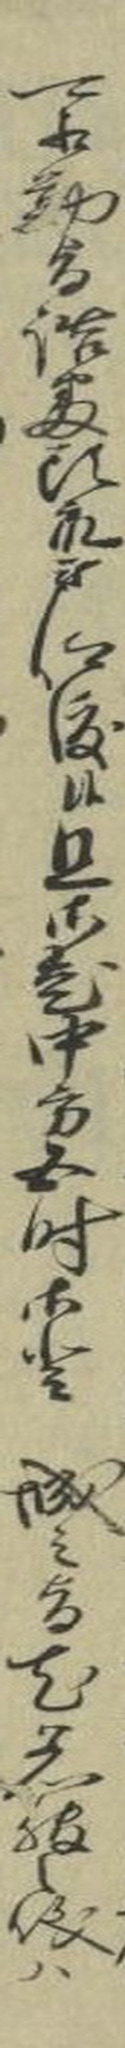可相勤旨詰番頭衆被仰渡候且御老中方五時御登城之旨尤着服之儀は
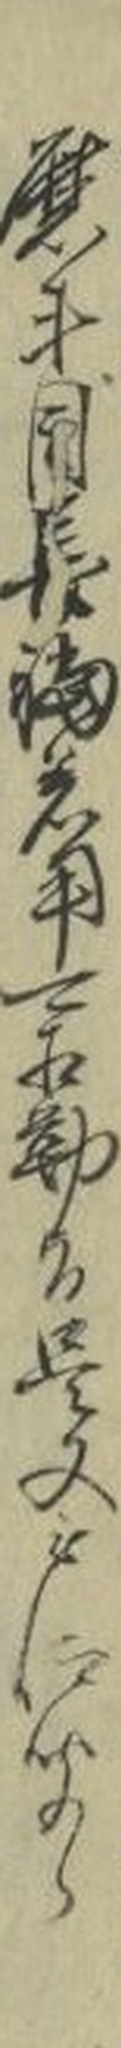熨斗目長襠着用可相勤旨是又被仰聞候
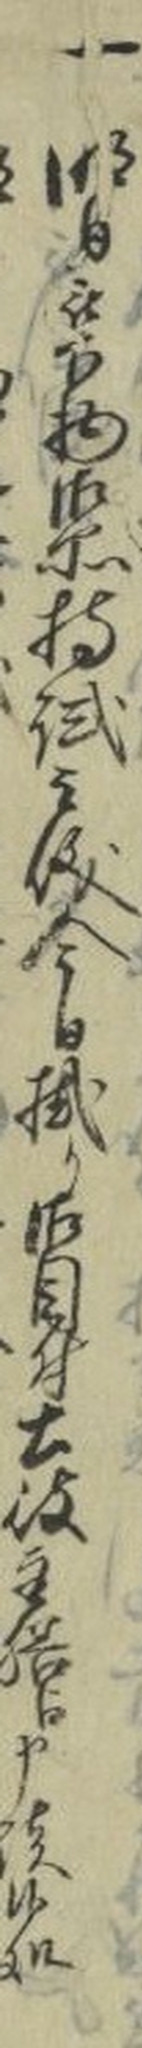一明日被下物御品持試之儀今日掛り御目付土岐主膳え申談候処
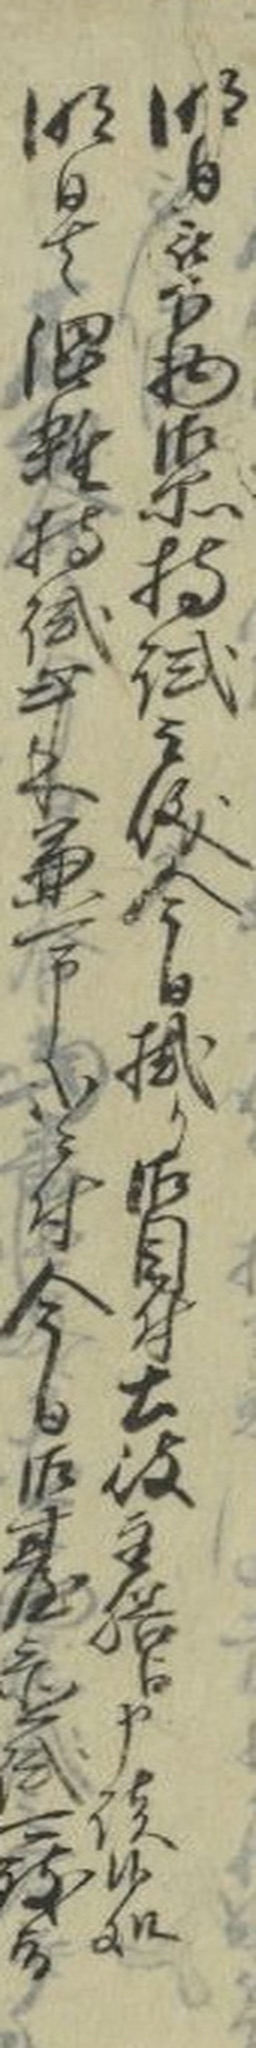明日は混雑持試出来兼可申哉に付今日御台置試可致旨
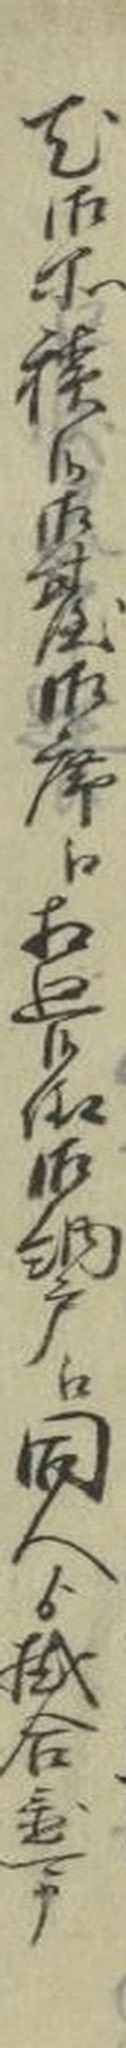尤御品積候御台御席え相廻候様御納戸え同人ゟ掛合置可申
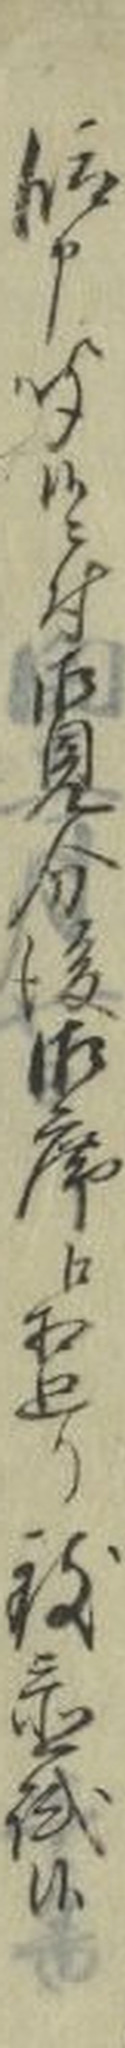仰申聞候に付御見分後御席え相廻り致置試候
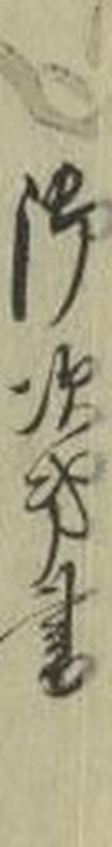御次第書
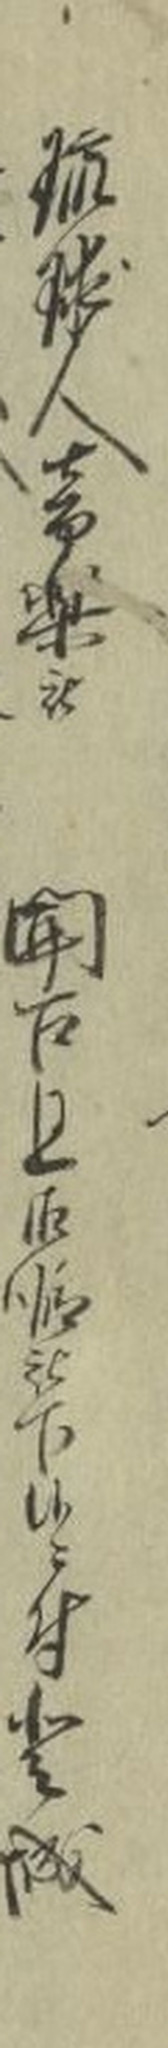一琉球人音楽被聞召且御暇被下候に付登城
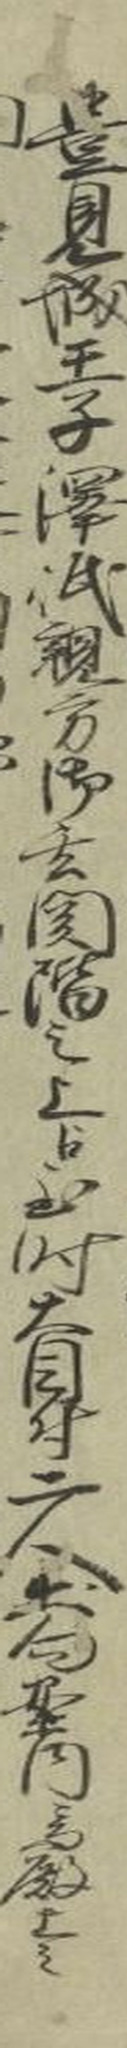一豊見城王子沢岻親方御玄関階之上え至時大目付二人出向案内にて殿上之
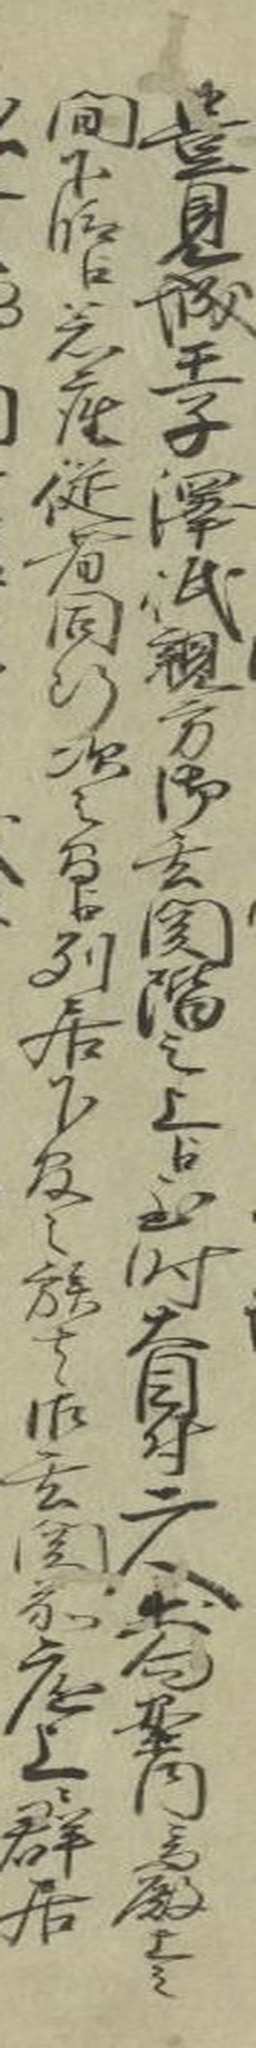間下段え着座従者同断次之間え列居下官之族は御玄関前庭上群居
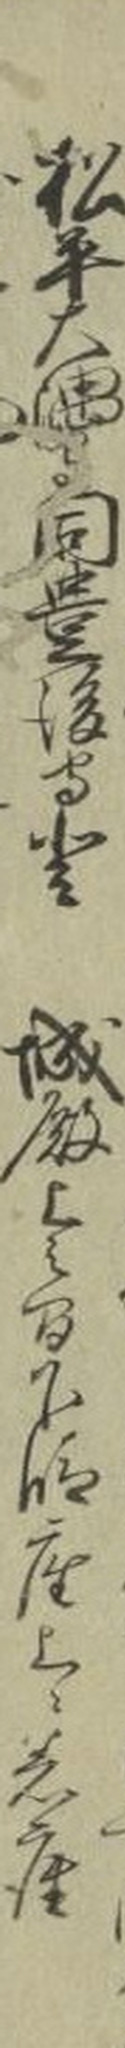一松平大隅守同豊後守登城殿上之間下段座上に着座
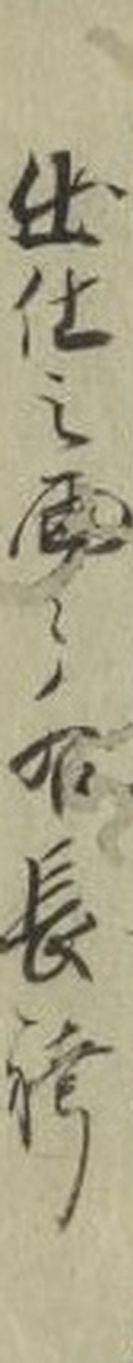一出仕之面々各長袴
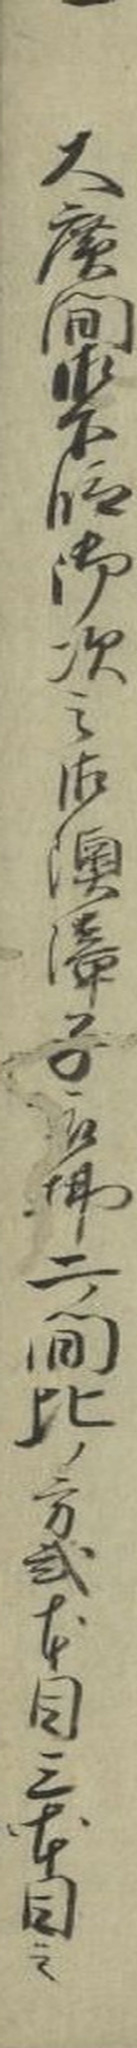一大広間御下段御次之御襖障子取払二の間北の方弐本目三本目之
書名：天保三壬辰年琉球人参府之節勤方書留
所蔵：University of the Ryukyus Library
